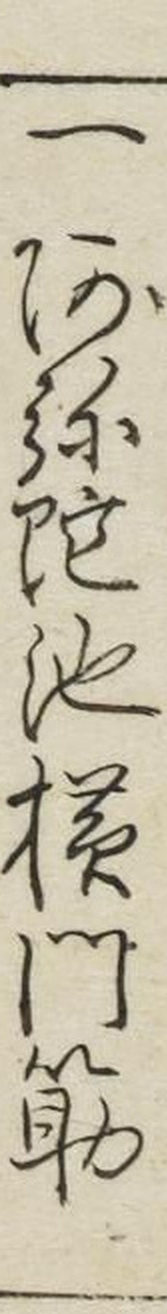一阿弥陀池横門筋
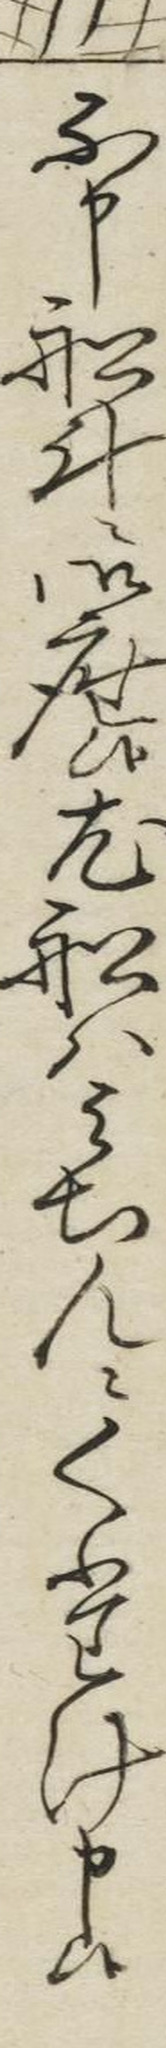不申船斗ニ御座候尤船ハミちんニくたけ申候
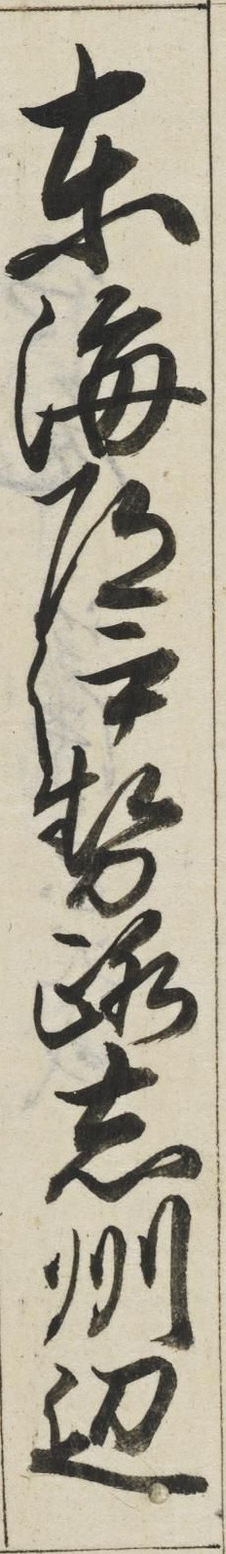東海道伊勢路志州辺
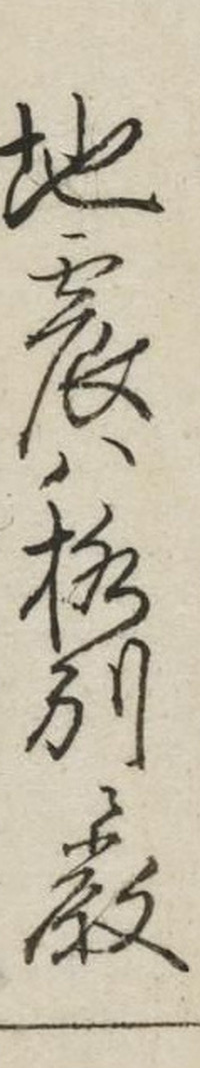地震ハ格別に是
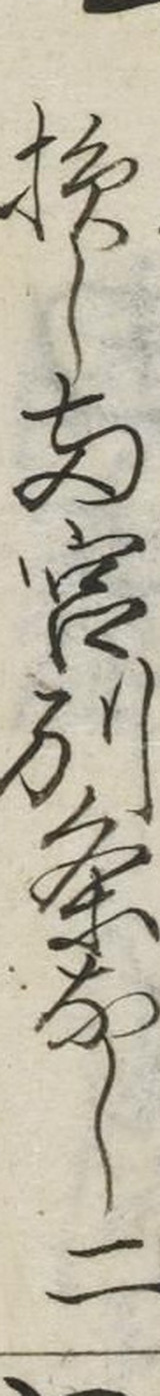損し両宮別条なし二
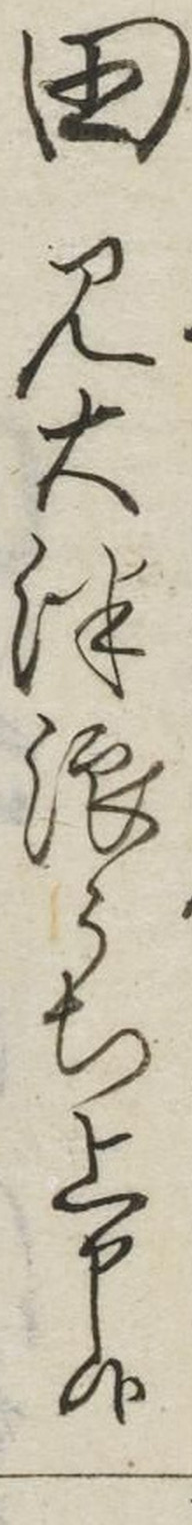見大津浪うち上申候
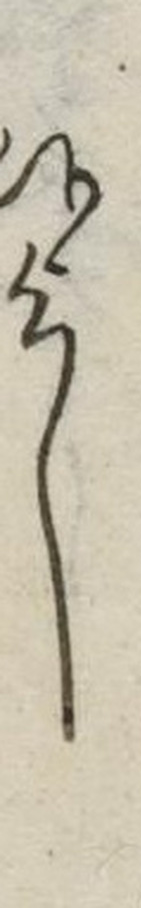候よし
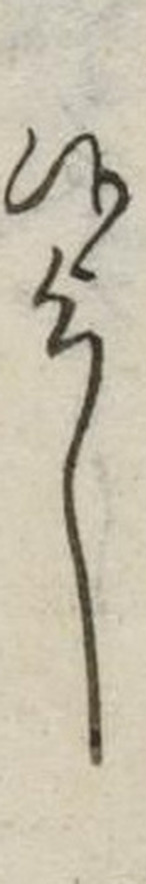候よし
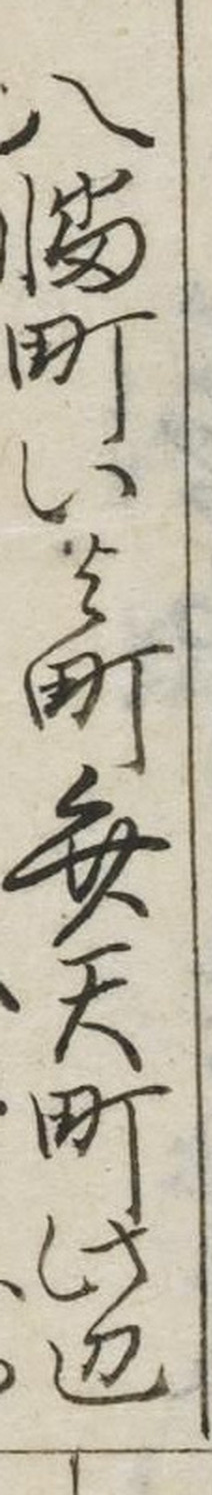津八幡町いよ町弁天町此辺
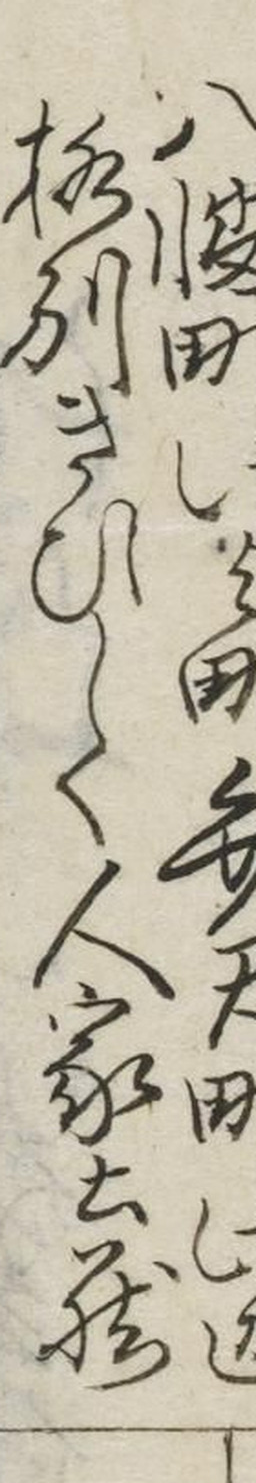格別きびしく人家土蔵
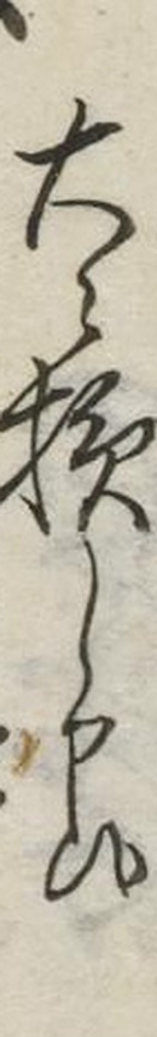大ニ損し申候
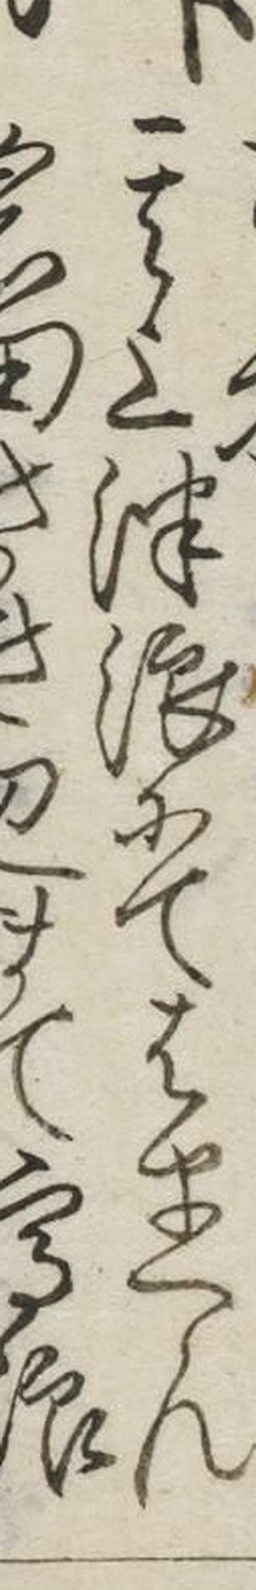岩田さき辺まて高浪
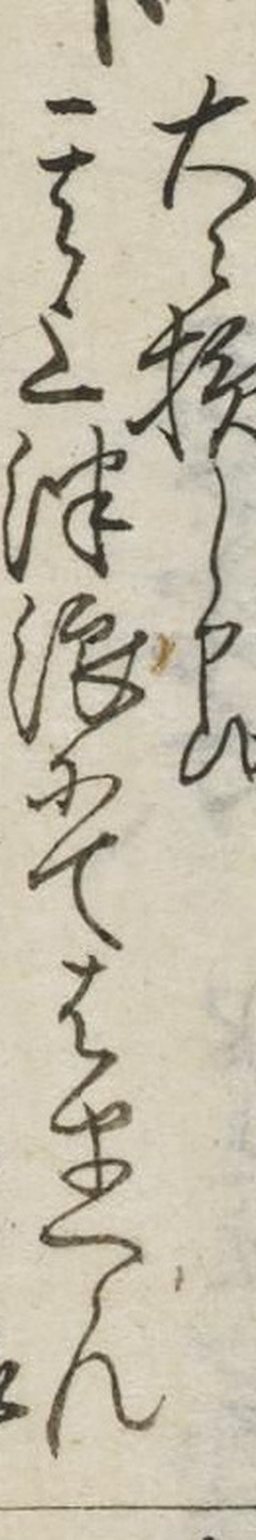其上津浪にてはまへん
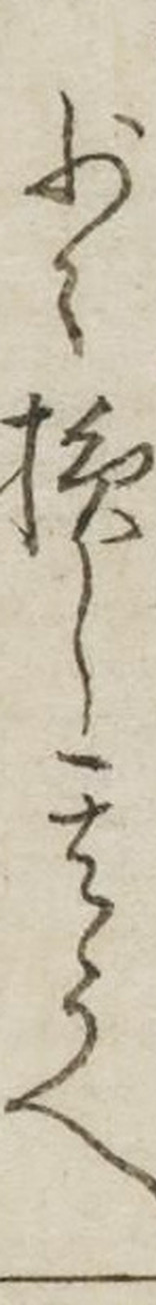少々損じ其うへ
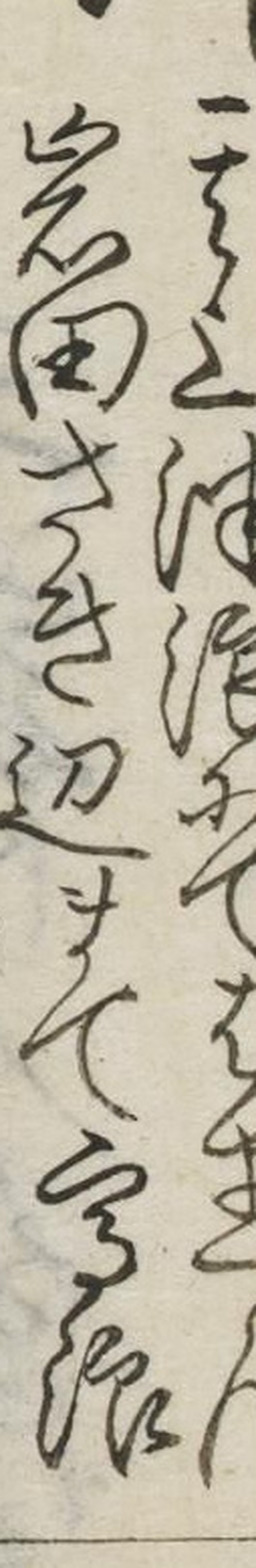岩田さき辺まて高浪
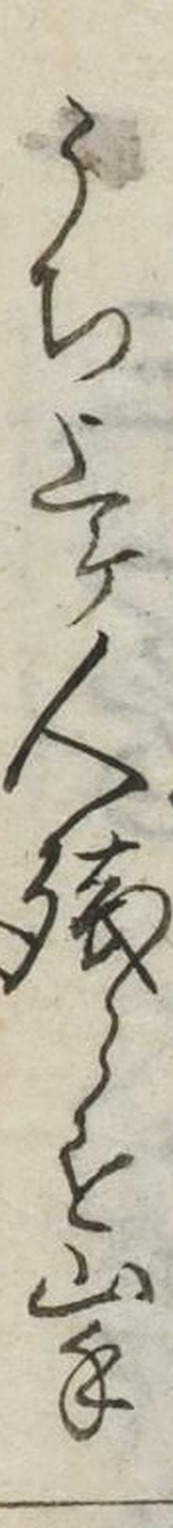うち上ケ人残らす山手
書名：大地震實録
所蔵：東京大学地震研究所図書室 Earthquake Research Institute Library, The University of Tokyo, JAPAN
